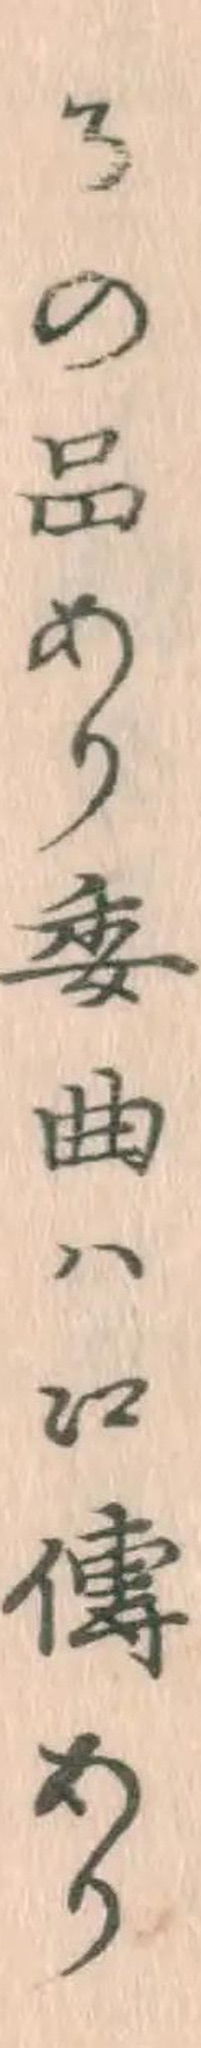るの品あり委曲は口伝あり
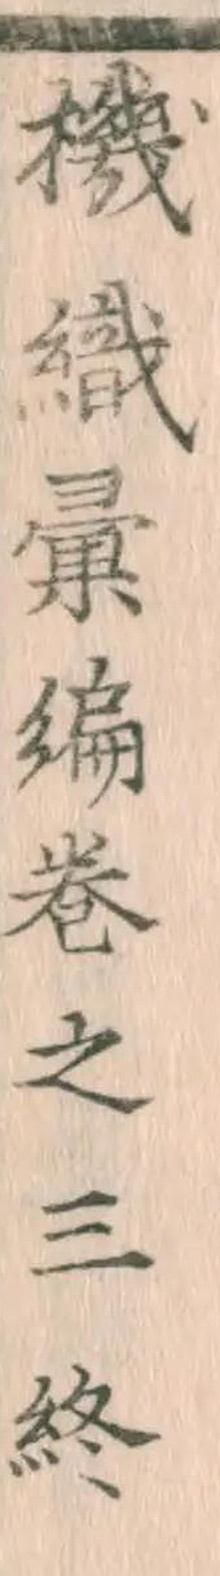機織彙編巻之三終
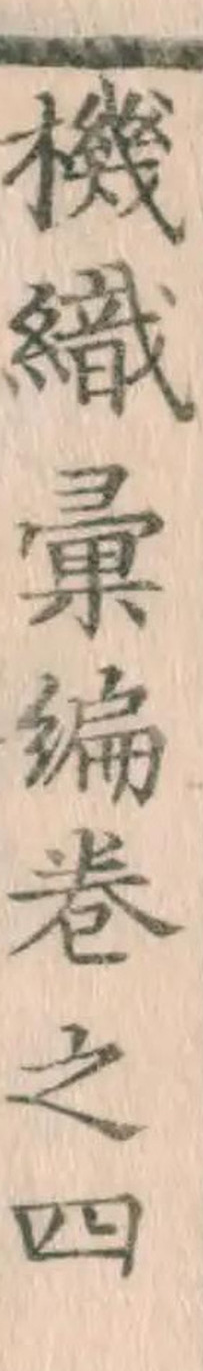機織彙編巻之四
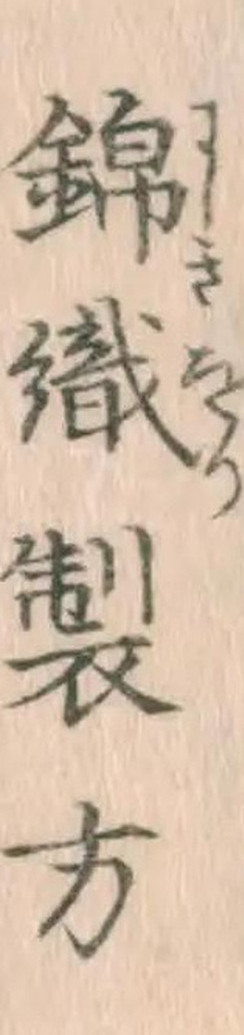錦織製方
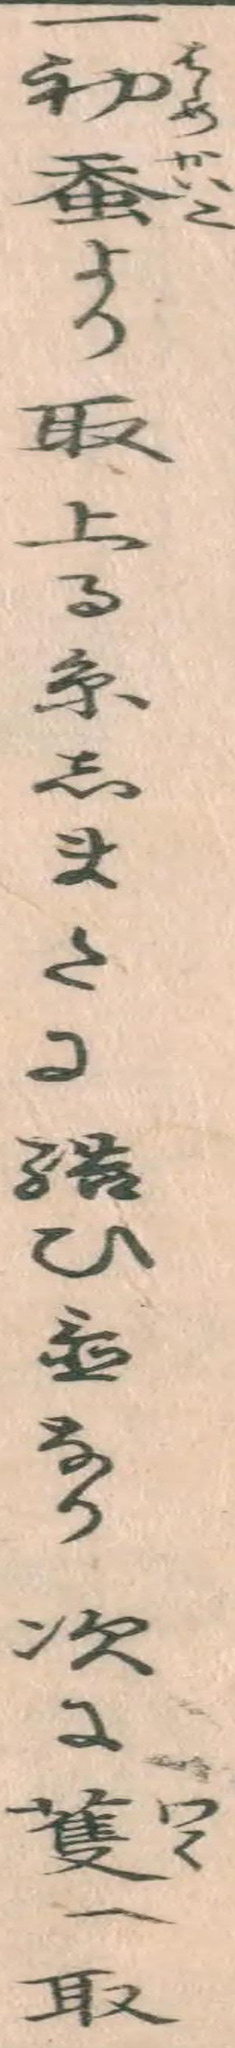一初蚕より取上る糸しまたに結ひ置なり次に蒦へ取
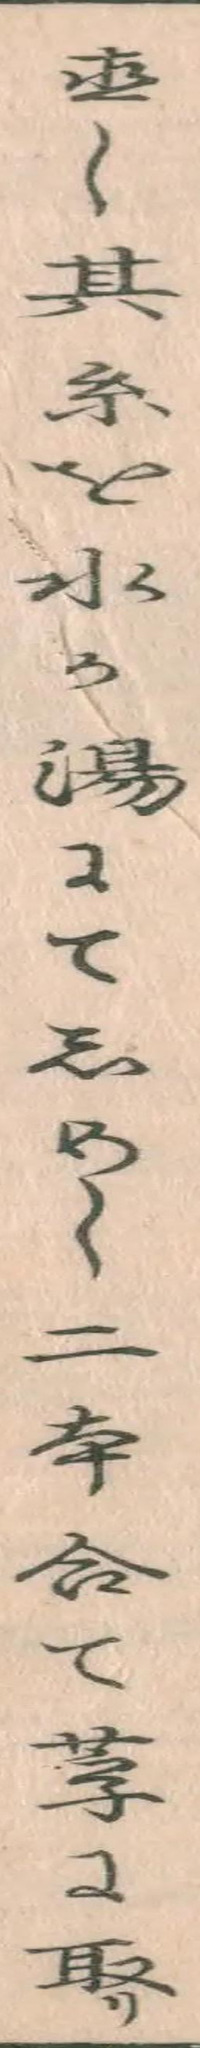直し其糸を水か湯にてしめし二本合て莩に取り
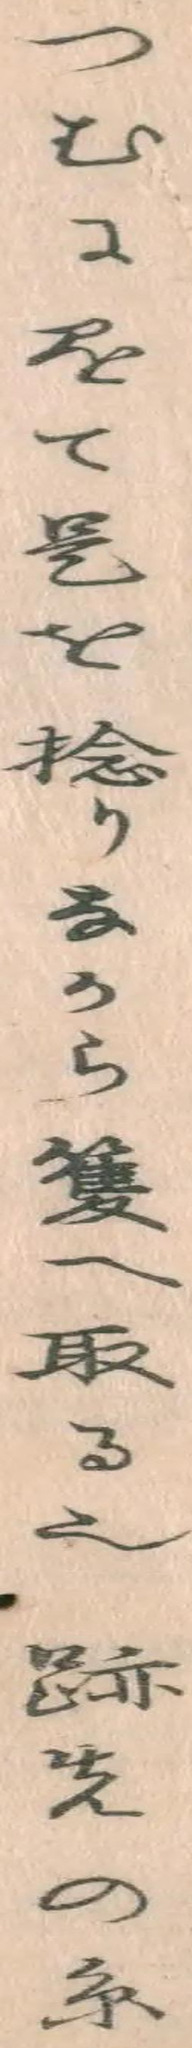つむに懸て是を捻りなから蒦へ取る也跡先の糸
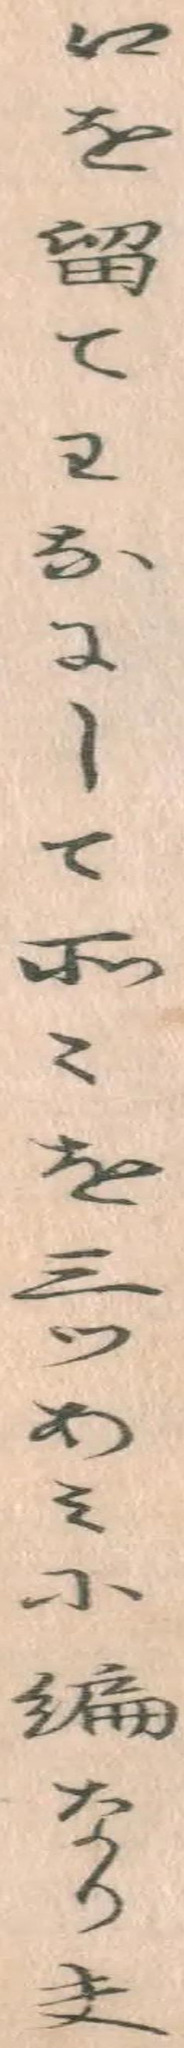口を留てわなにして所々を三ッあみに編なり夫
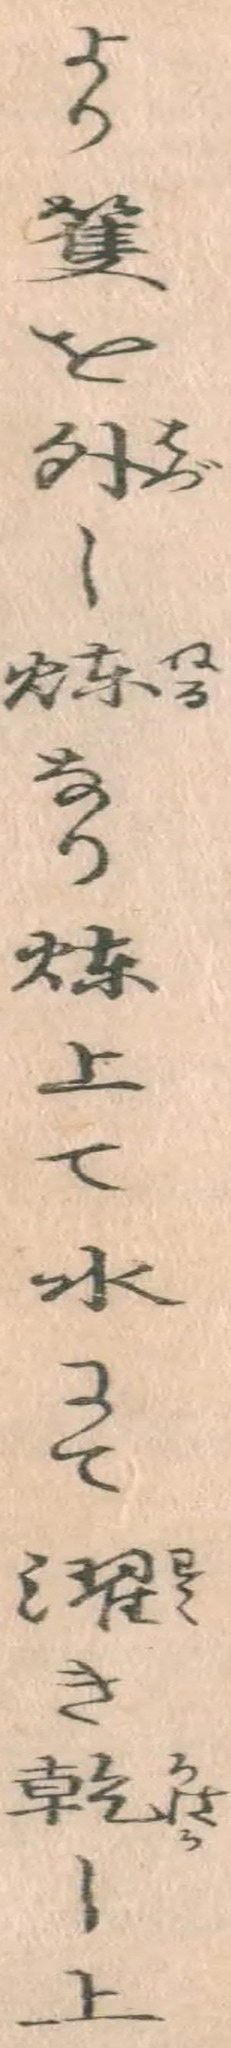より蒦を外し煉なり煉上て水にて濯き乾し上
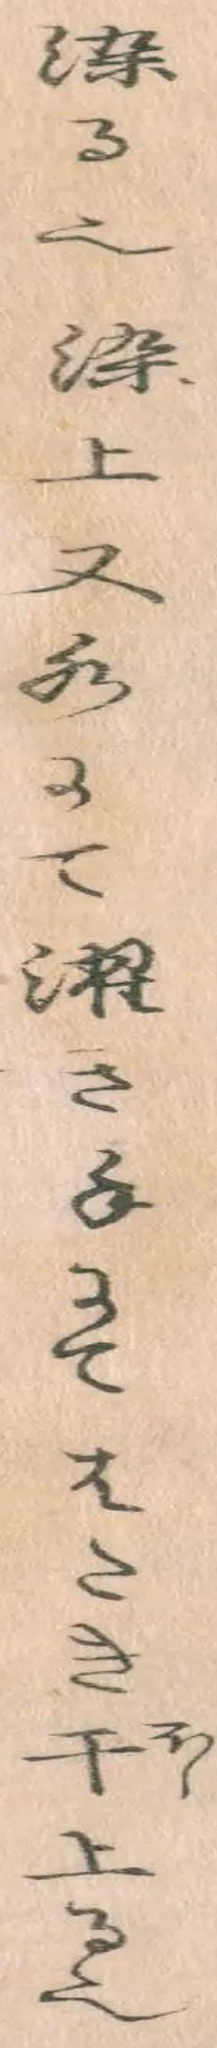染る也染上又水にて濯き手にてはたき干上る也
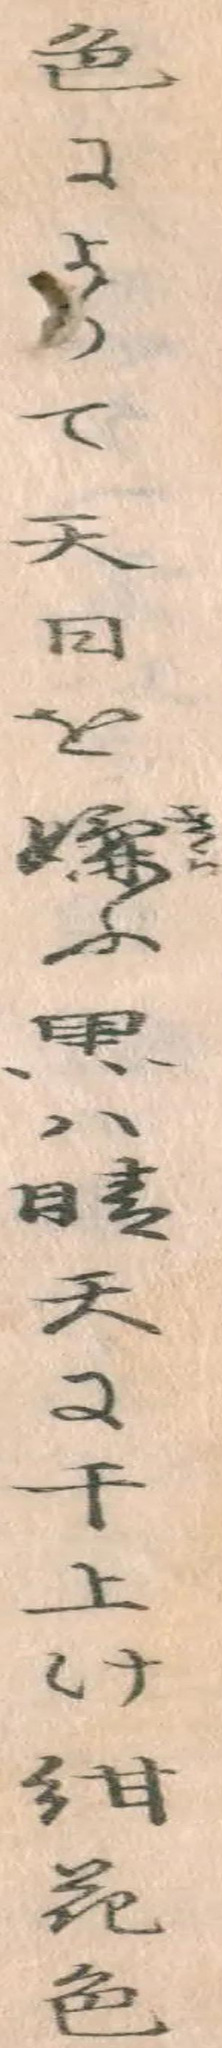色によりて天日を嫌ふ黒は晴天に干上け紺花色
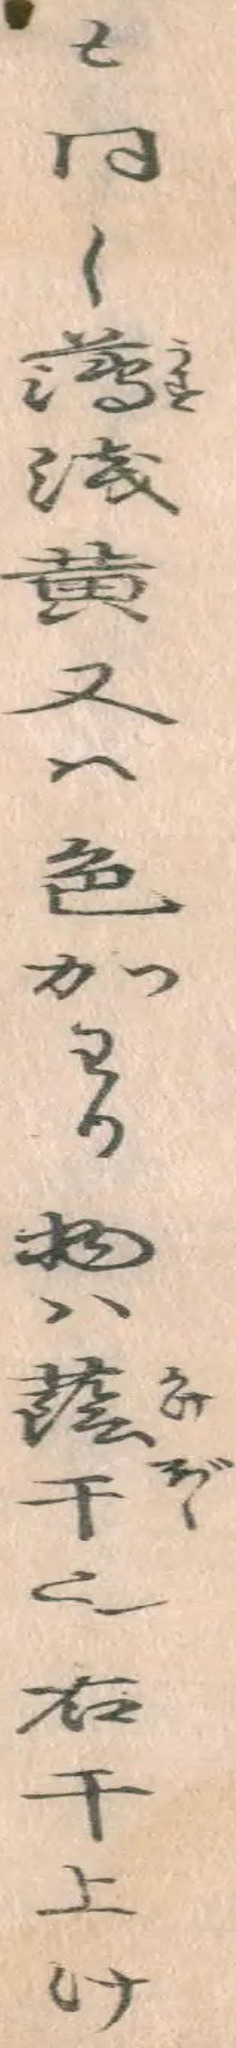も同し薄浅黄又は色かわり物は蔭干也右干上け
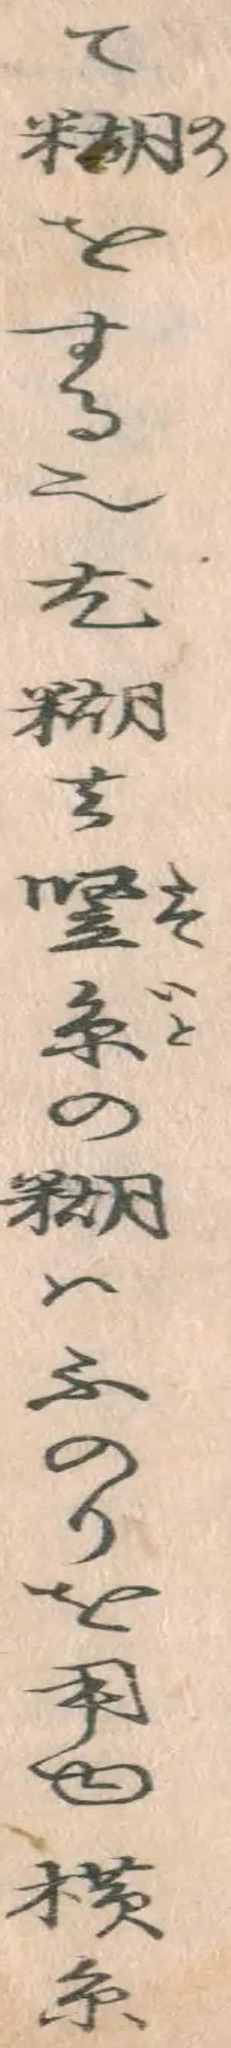て糊をする也尤糊は竪糸の糊はふのりを用ゆ横糸
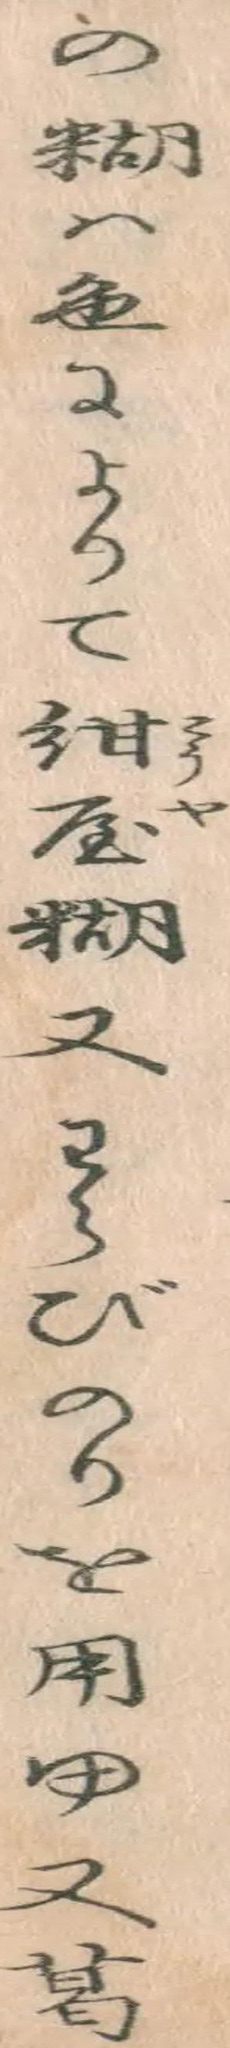の糊は色によりて紺屋糊又わらびのりを用ゆ又葛
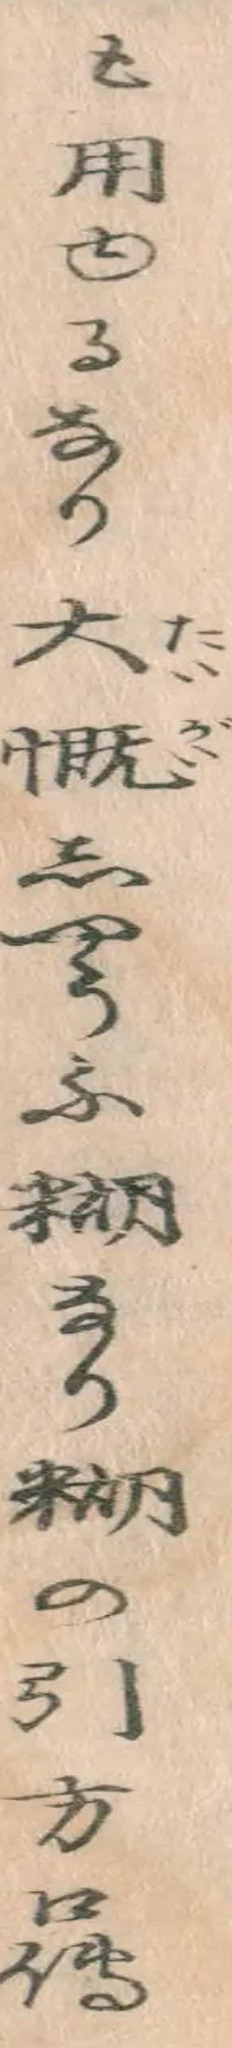も用ゆるなり大慨しやうふ糊なり糊の引方口伝

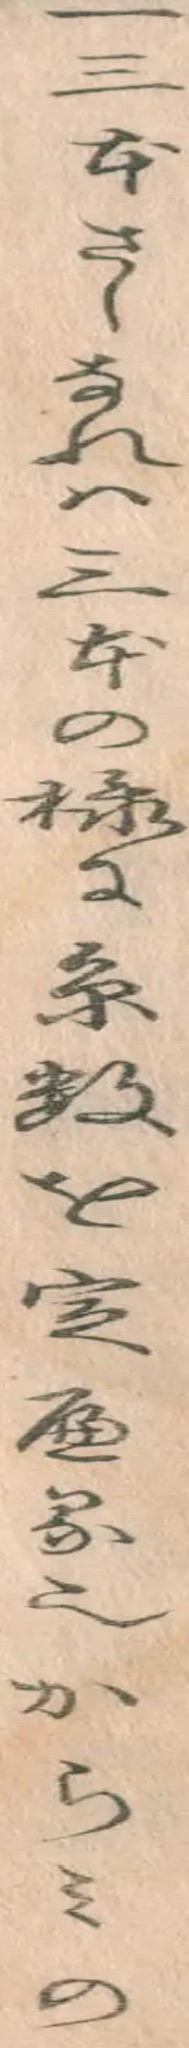一三本さしなれは三本の様に糸数を定へる也からみの
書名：機織彙編 5巻. [2]
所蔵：国立国会図書館 National Diet Library, JAPAN
